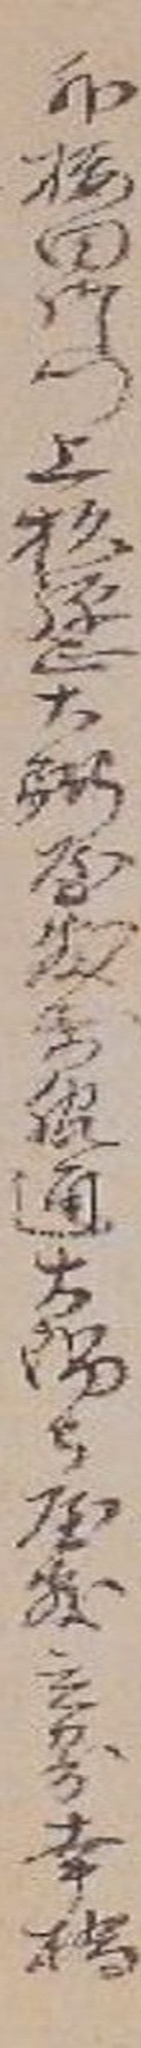外桜田御門上杉弾正大弼屋敷前脇通大隅守屋敷立寄幸橋
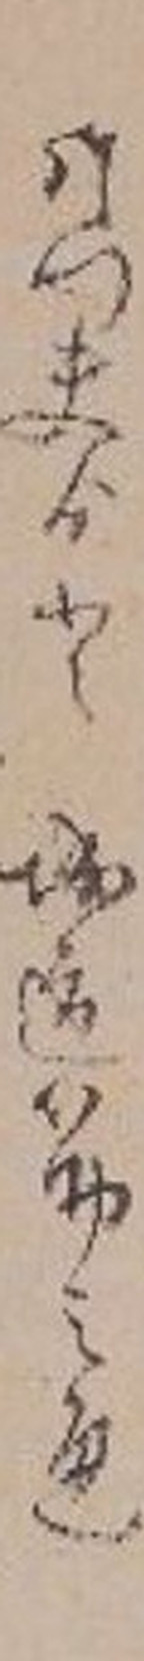御門夫ゟ登城道筋之通

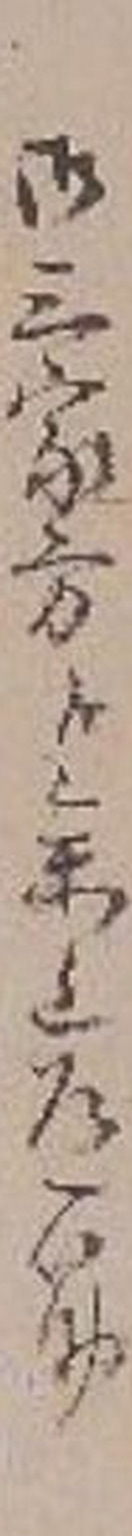御三家方え参上道筋
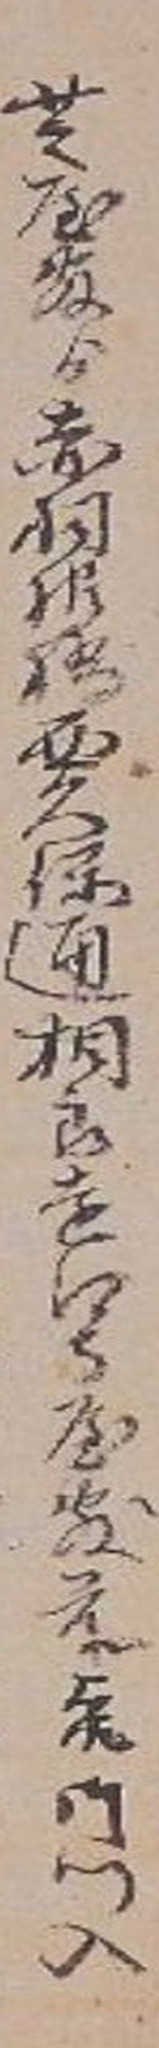芝屋敷ゟ赤羽根橋西久保通相良遠江守屋敷前虎御門入
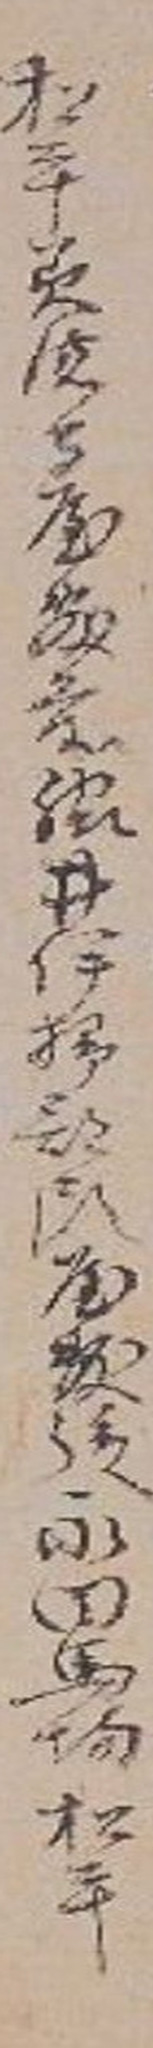松平美濃守屋敷前脇井伊掃部頭屋敷後永田馬場松平
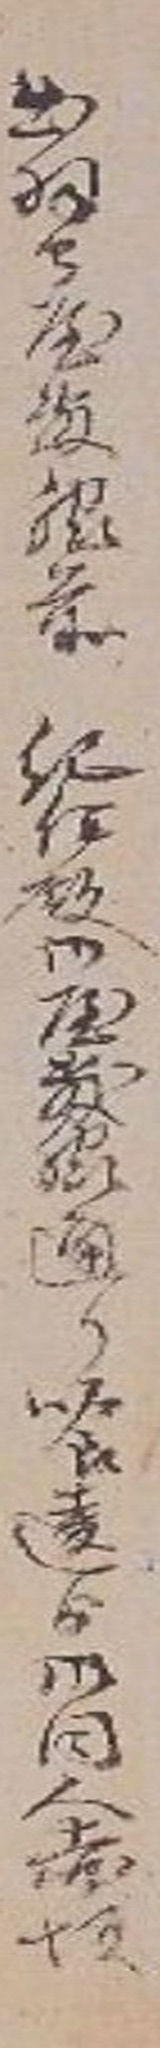出羽守屋敷脇前紀伊殿御屋敷脇通り喰違ゟ御同人赤坂
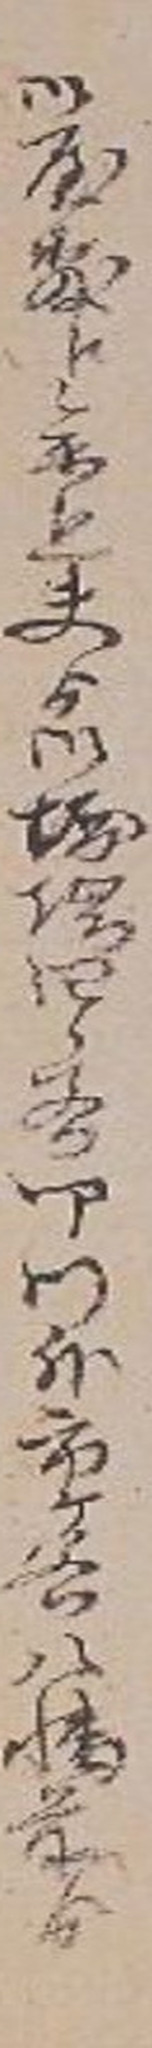御屋敷え参上夫ゟ堀端四つ谷御門外市ヶ谷八幡前ゟ
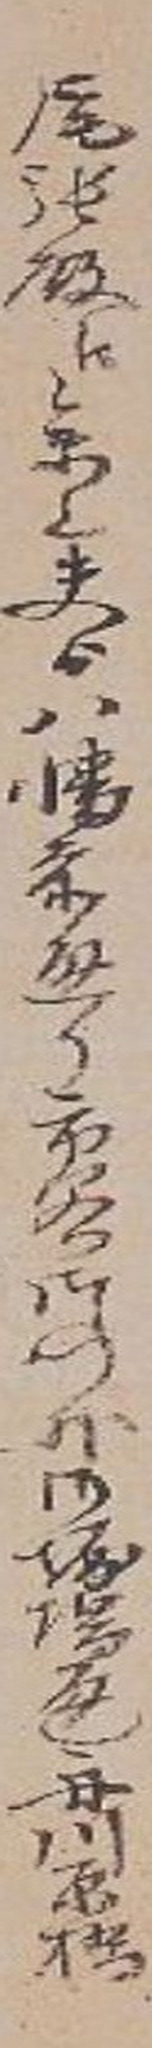尾張殿え参上夫ゟ八幡前通り市谷御門外御堀端通舟川原橋
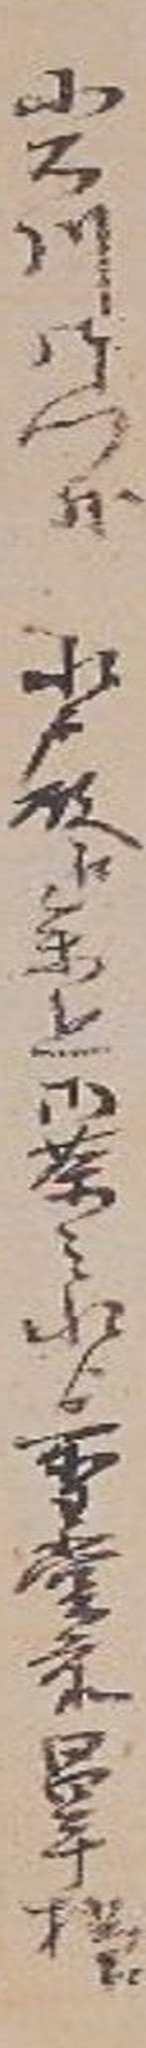小石川御門外水戸殿え参上御茶之水ゟ聖堂前昌平橋え
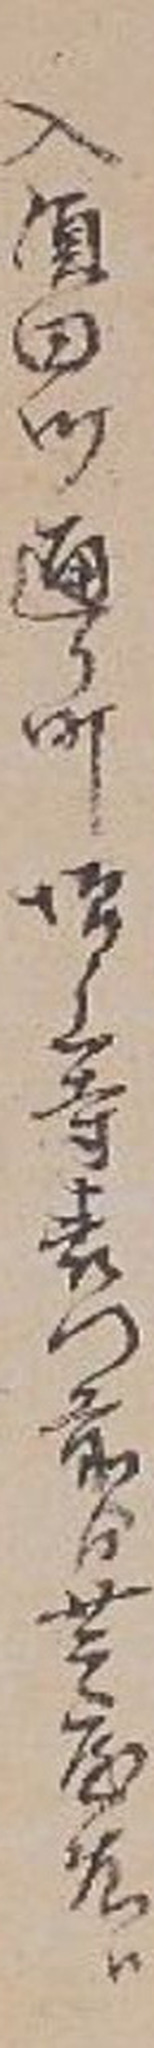入須田町通り町増上寺表門前ゟ芝屋敷え
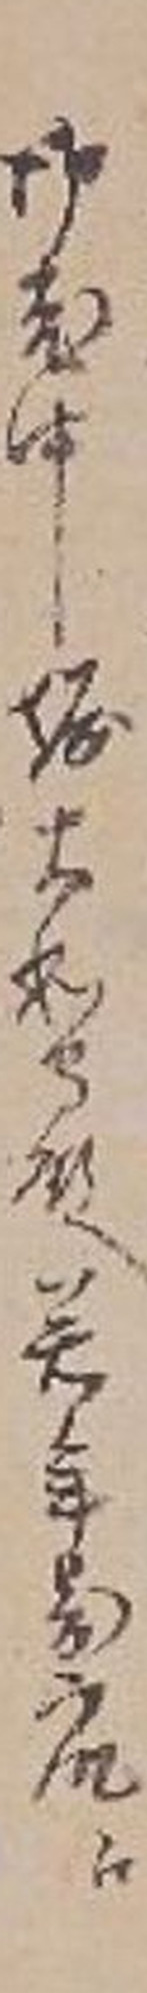御老中堀大和守殿若年寄衆え
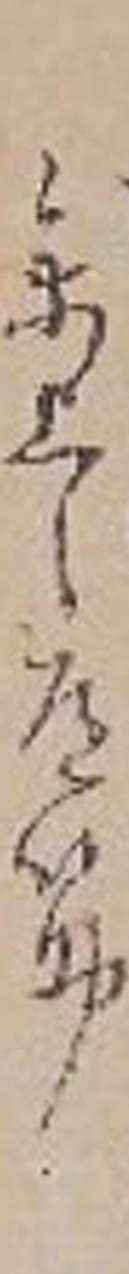参上之道筋
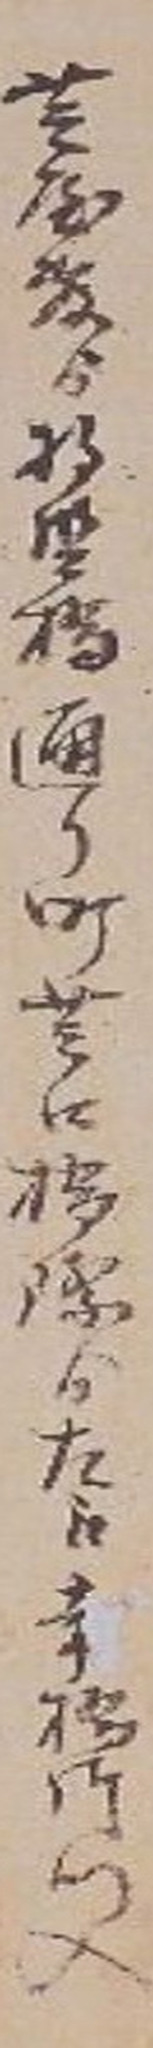芝屋敷ゟ将監橋通り町芝口橋際ゟ左え幸橋御門入
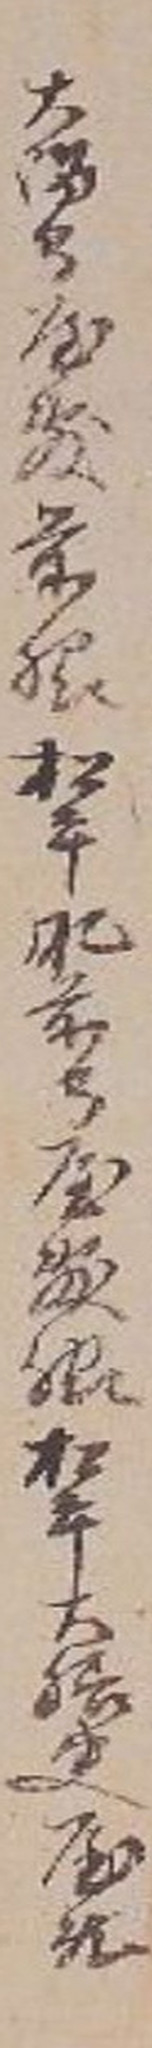大隅守屋敷前脇松平肥前守屋敷脇松平大膳大夫屋敷
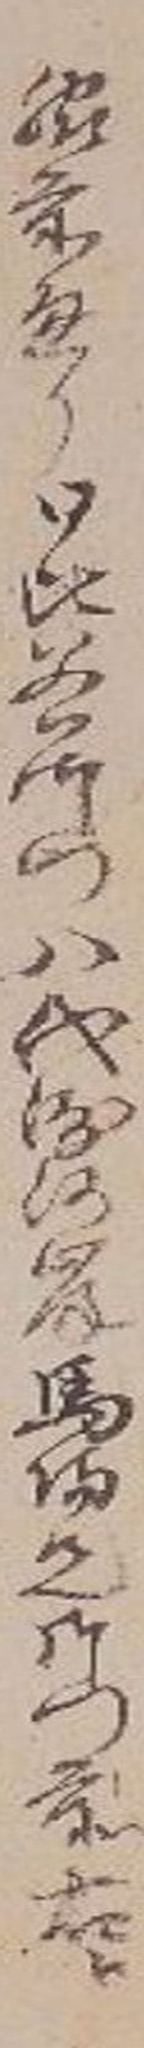脇前通り日比谷御門八代洲河岸馬場先御門前左え
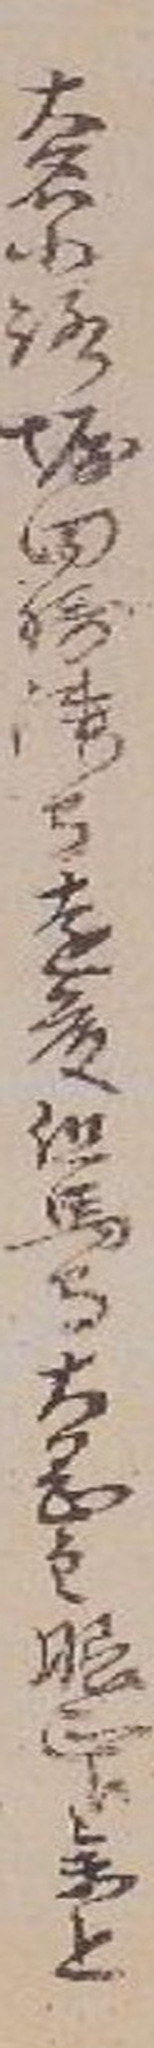大名小路堀田摂津守遠藤但馬守大岡主膳正え参上
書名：琉球来聘志(仮) 天保十三年
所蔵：University of the Ryukyus Library
